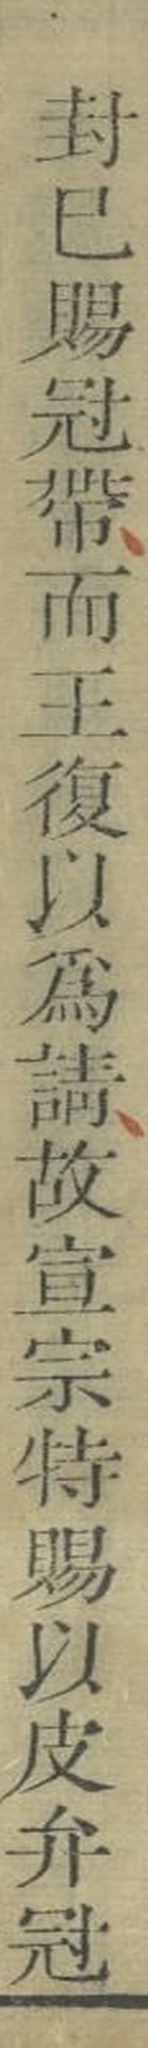封巳賜冠帯而王復以為請故宣宗特賜以皮弁冠
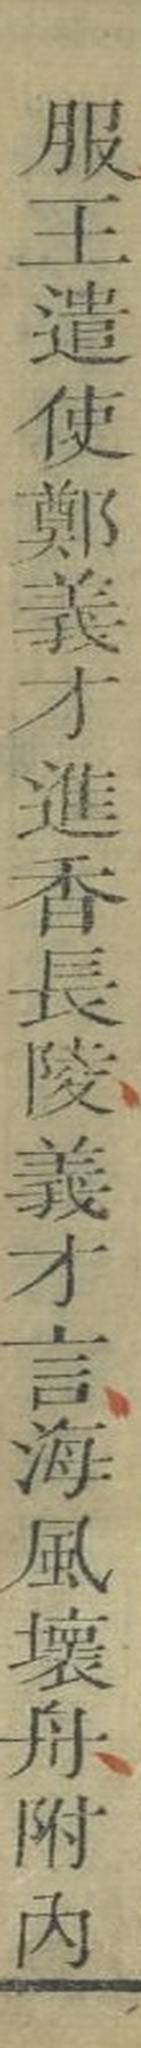服王遣使鄭義才進香長陵義才言海風壊舟附内
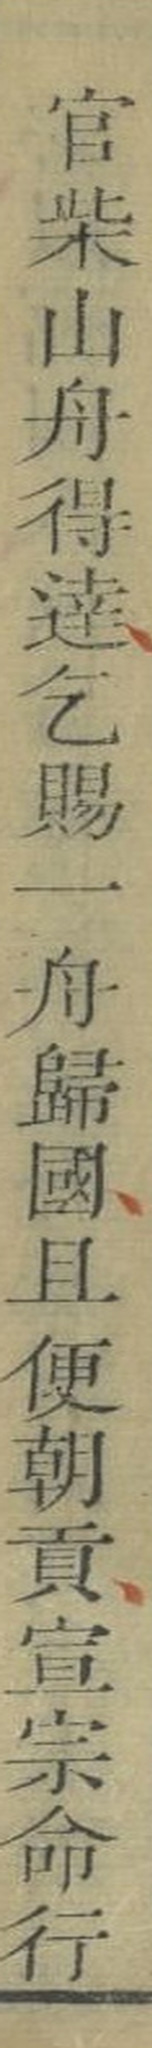官柴山舟得達乞賜一舟帰国且便朝貢宣宗命行
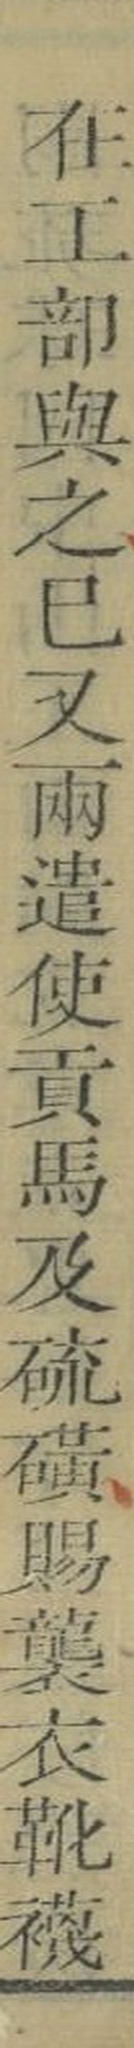在工部与之巳又両遣使貢馬及硫磺賜襲衣靴襪
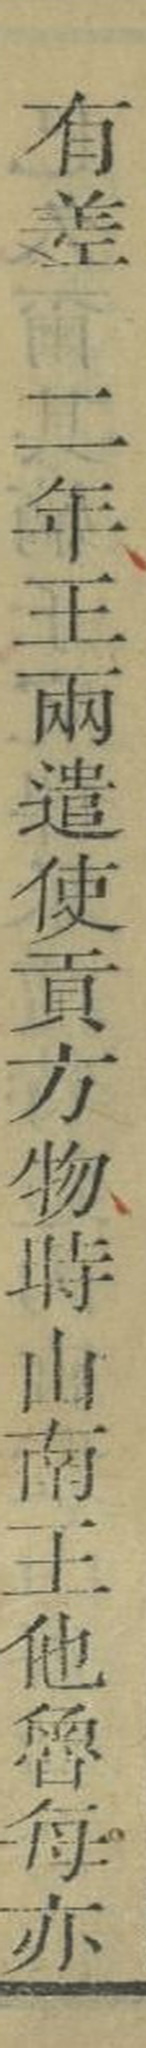有差二年王両遣使貢方物時山南王他魯毎亦
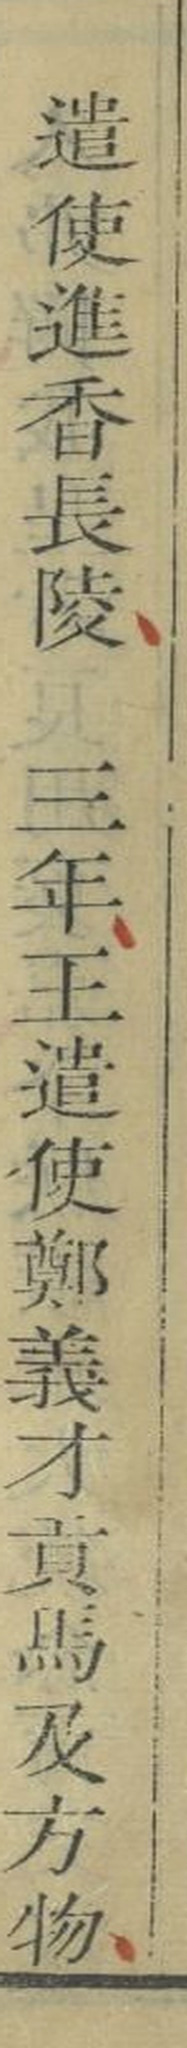遣使進香長陵三年王遣使鄭義才貢馬及方物
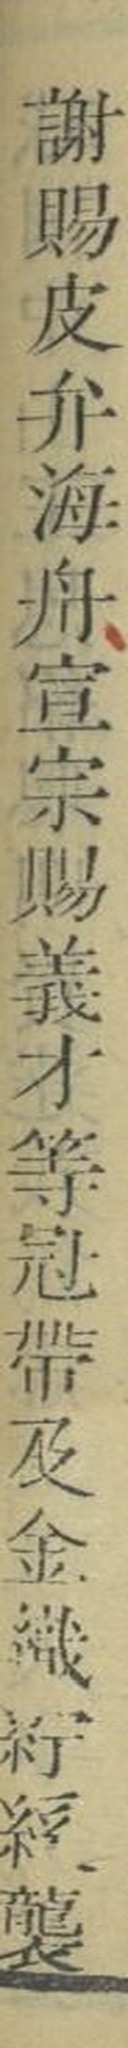謝賜皮弁海舟宣宗賜義才等冠帯及金織紵糸襲
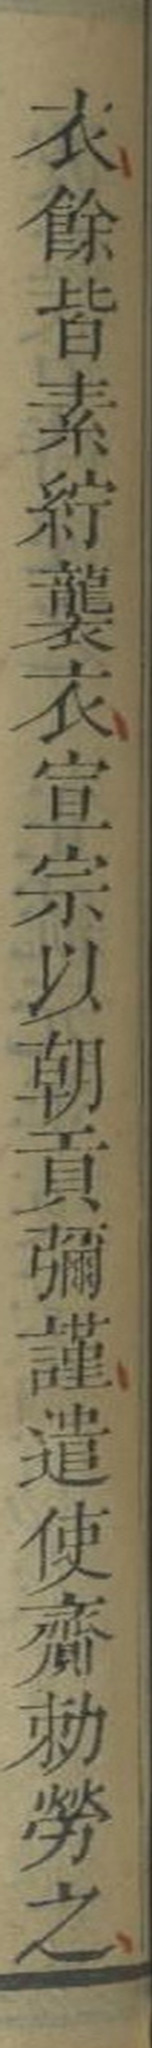衣余皆素紵襲衣宣宗以朝貢弥謹遣使齎勅労之
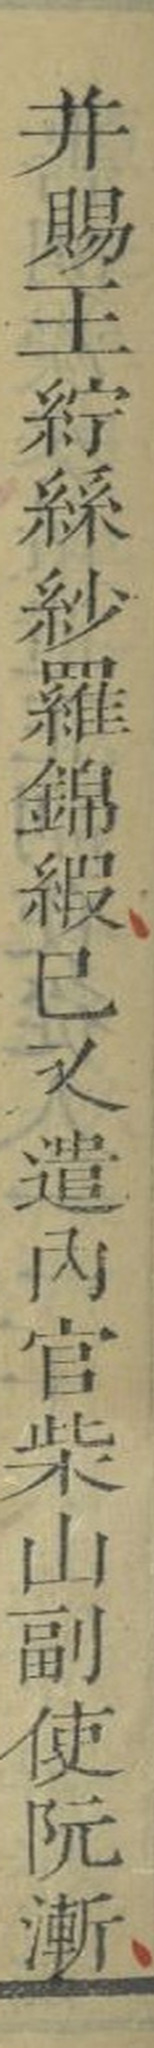并賜王紵糸紗羅錦緞巳又遣内官柴山副使阮漸
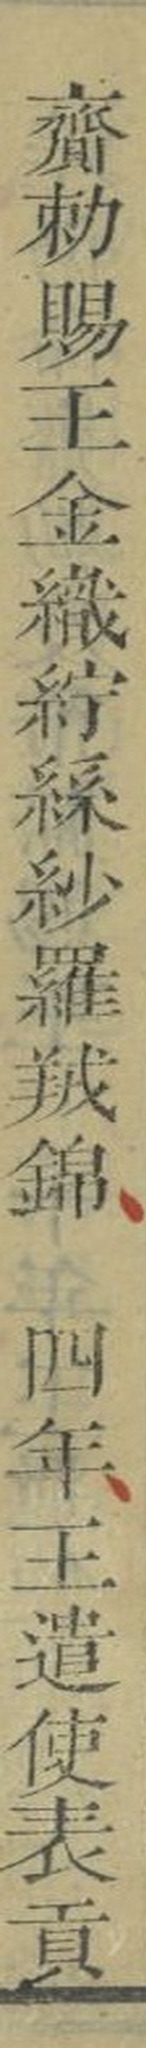齎勅賜王金織紵糸紗羅羢錦四年王遣使表貢
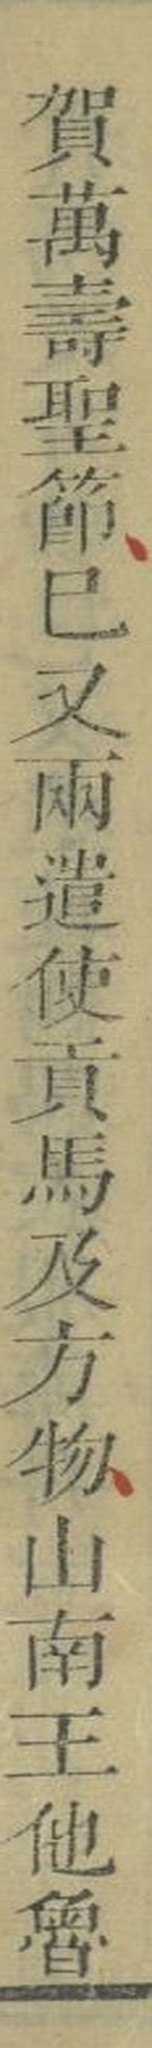賀万寿聖節巳又両遣使貢馬及方物山南王他魯
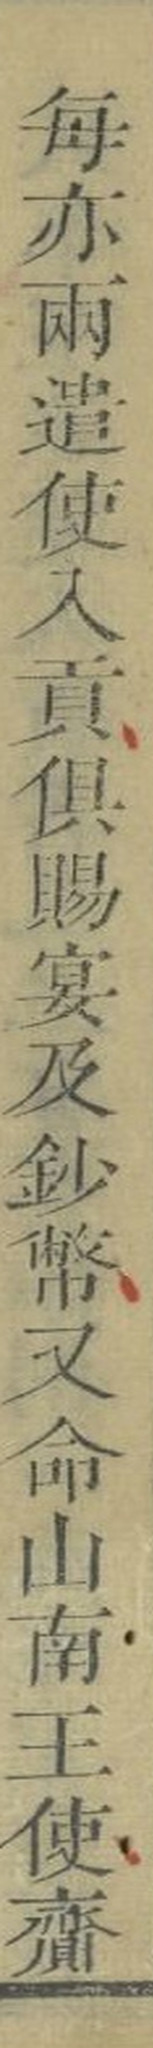毎亦両遣使入貢俱賜宴及鈔幣又命山南王使齎
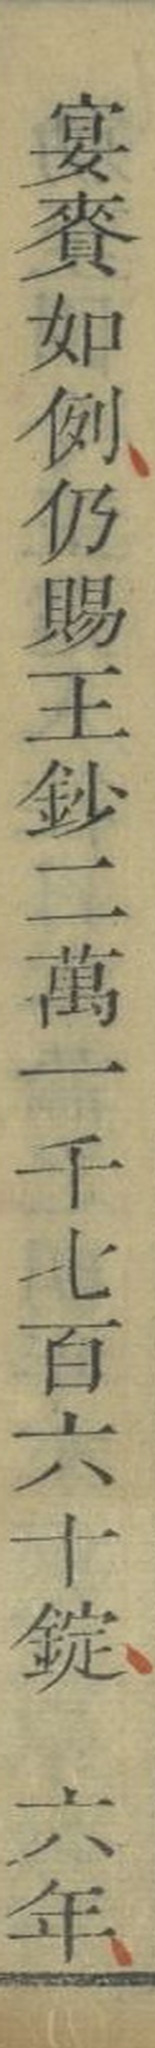宴賚如例仍賜王鈔二万一千七百六十錠六年
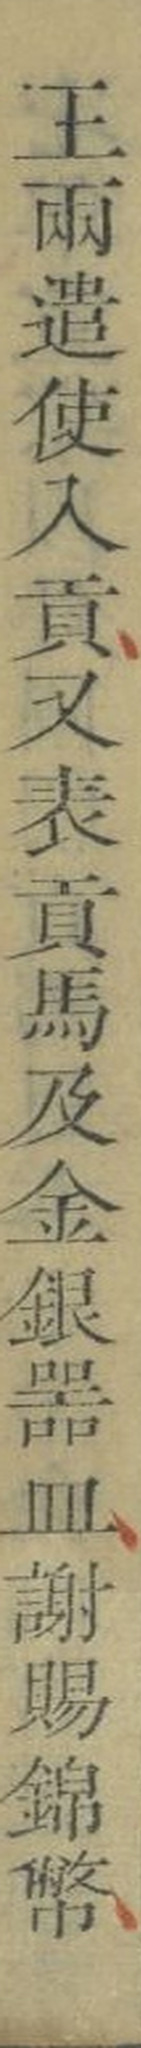王両遣使入貢又表貢馬及金銀器皿謝賜錦幣

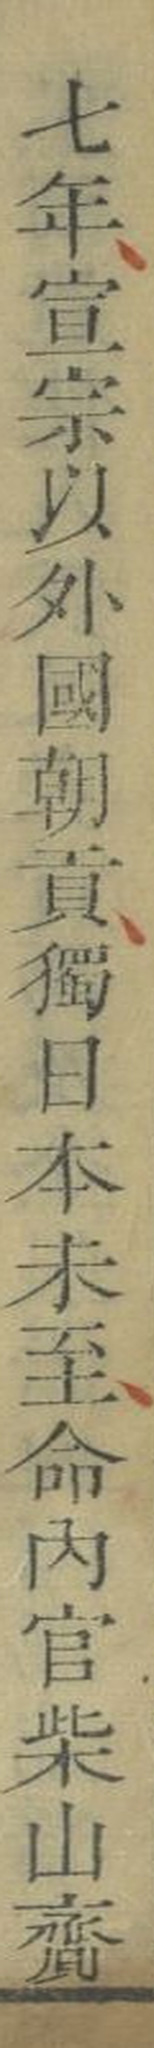七年宣宗以外国朝貢独日本未至命内官柴山齎
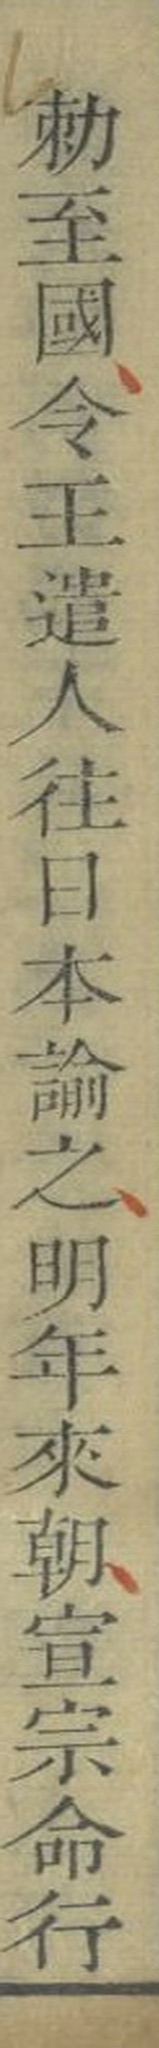勅至国令王遣人往日本諭之明年来朝宣宗命行
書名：中山伝信録 巻三
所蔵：University of the Ryukyus Library
